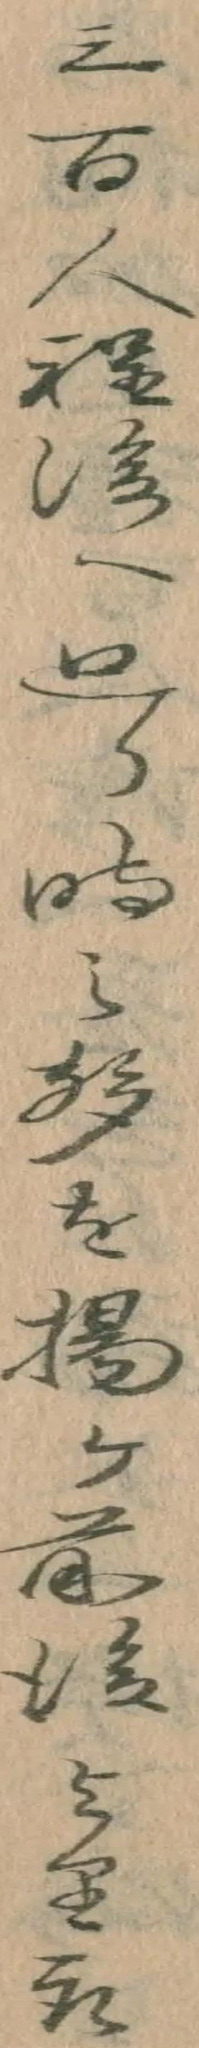三百人程後へ廻り時之声を揚け前後与里取
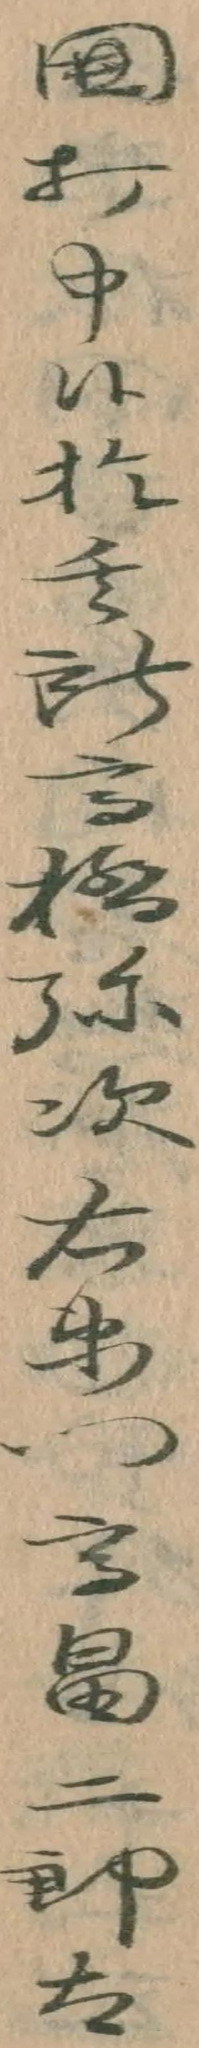囲打申候於其所高橋弥次右衛門高畠二郎太
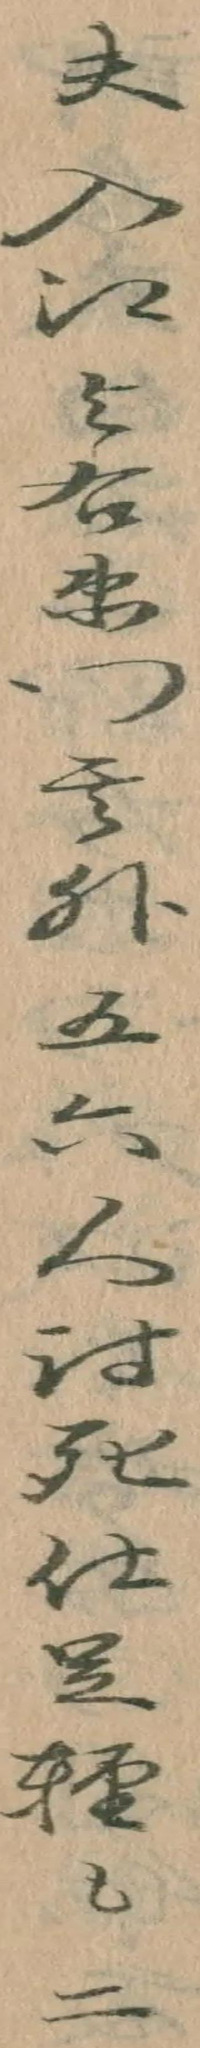夫入江与右衛門其外五六人討死仕足軽も二
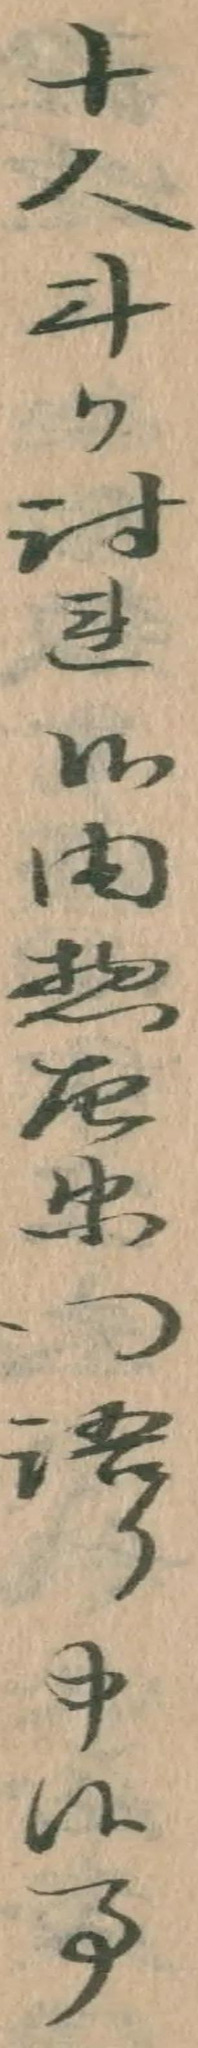十人斗り討連候由惣左衛門語り申候事
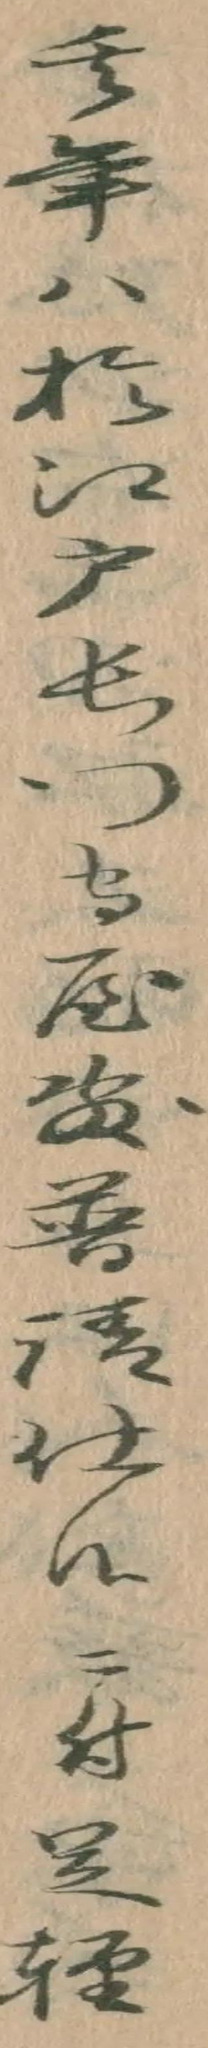其年は於江戸長門守屋敷普請仕候に付足軽
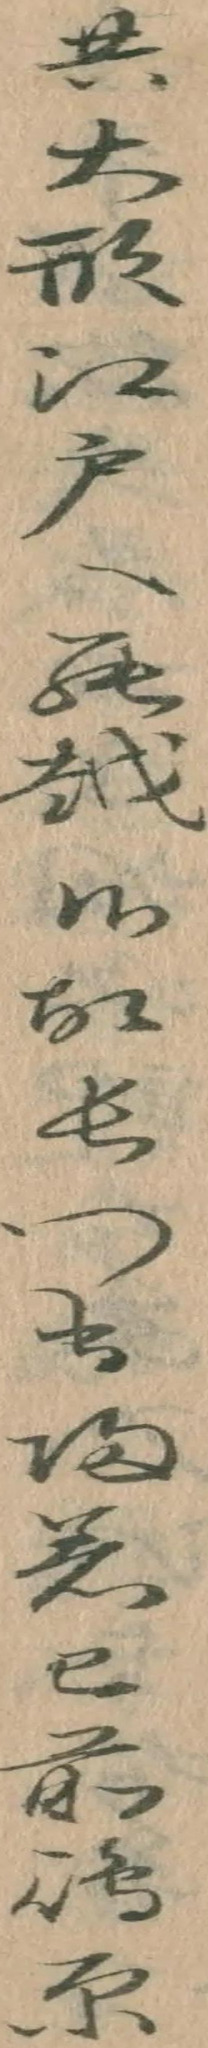共大形江戸へ罷越候故長門守帰着已前島原
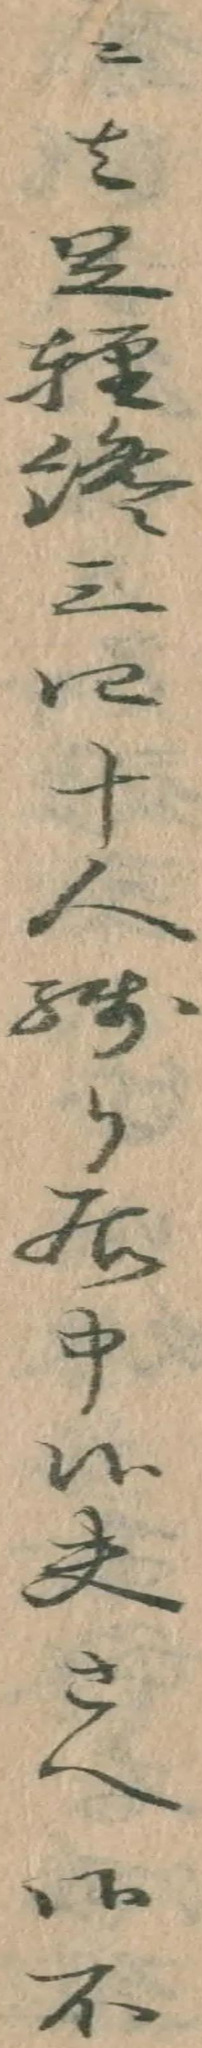に者足軽纔三四十人残り居申候夫さへ御不
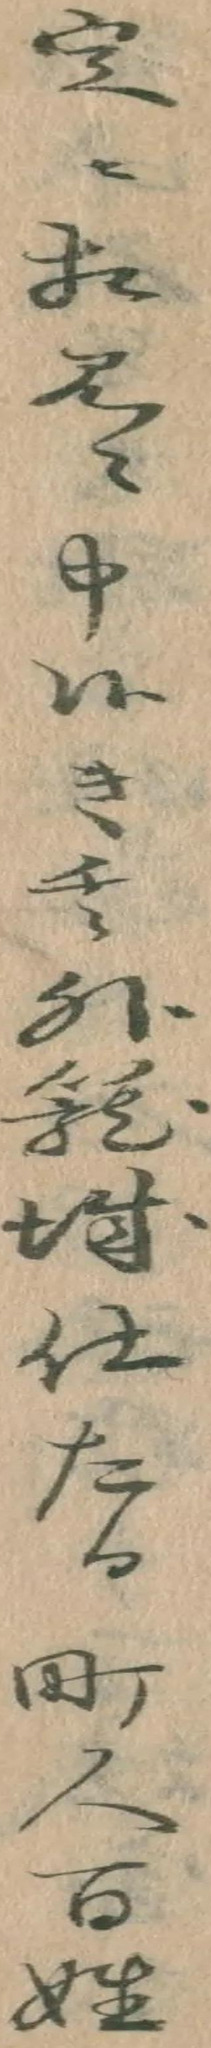定に相見に申候き其外籠城仕たる町人百姓
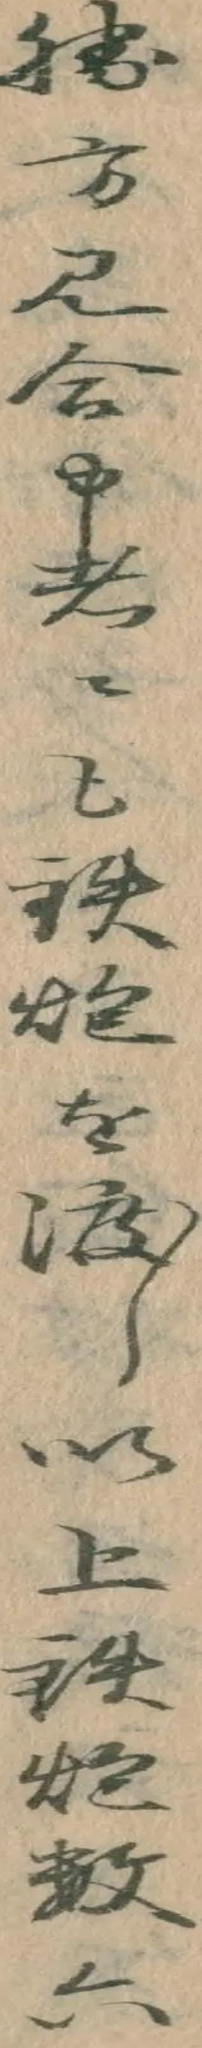勝方見合申者にも鉄炮を渡し以上鉄炮数六
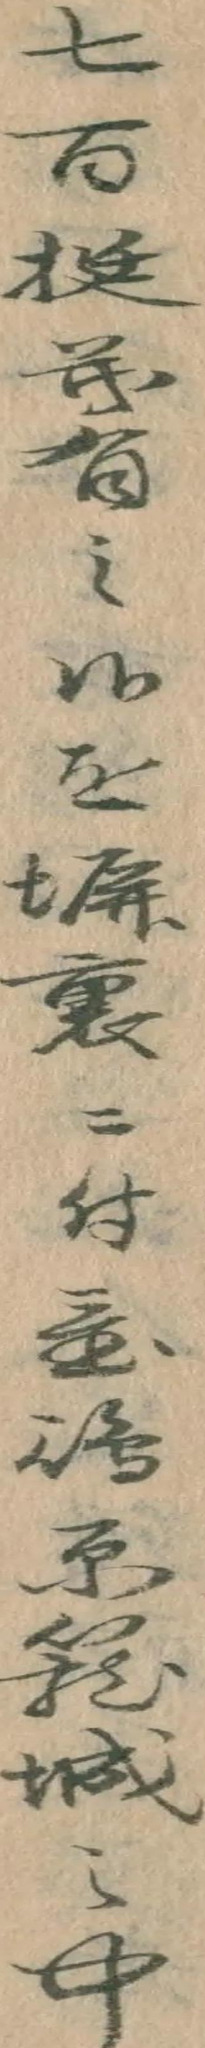七百挺茂有之候を塀裏に付置島原籠城之中
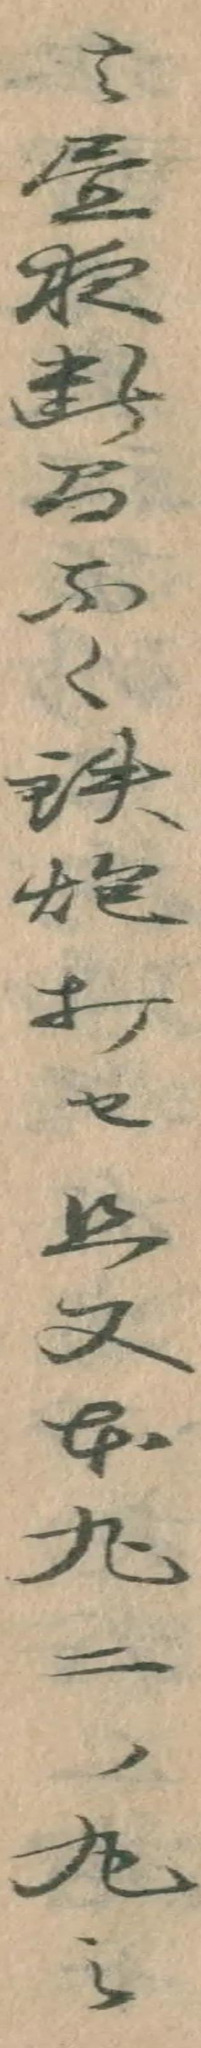者昼夜断間なく鉄炮打せ且又本丸二の丸之
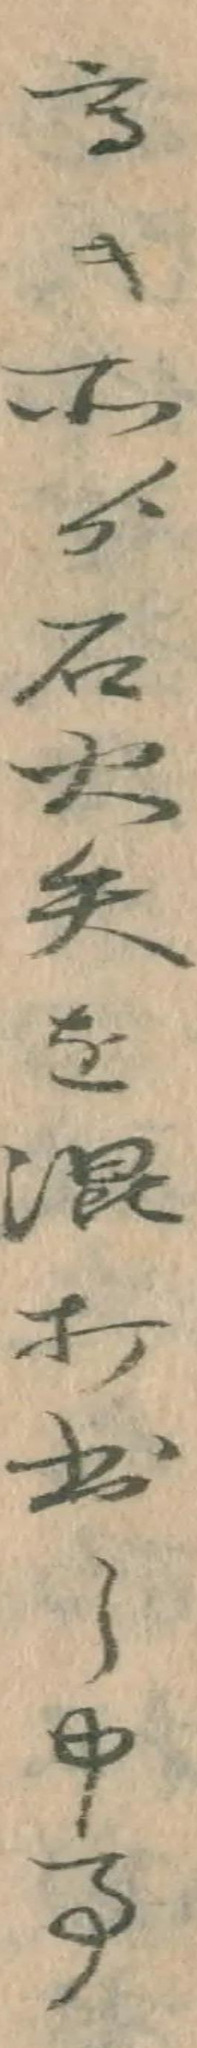高き所ゟ石火矢を混打出し申事
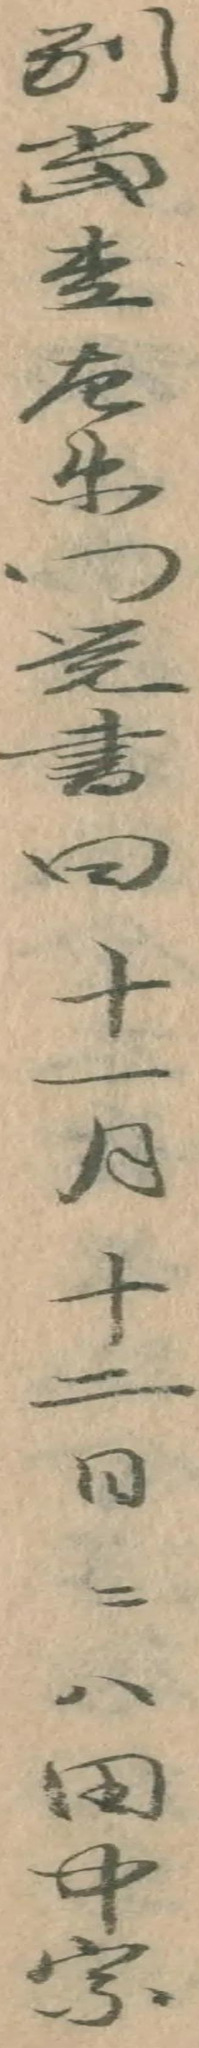別当杢左衛門覚書曰十一月十二日には田中宗

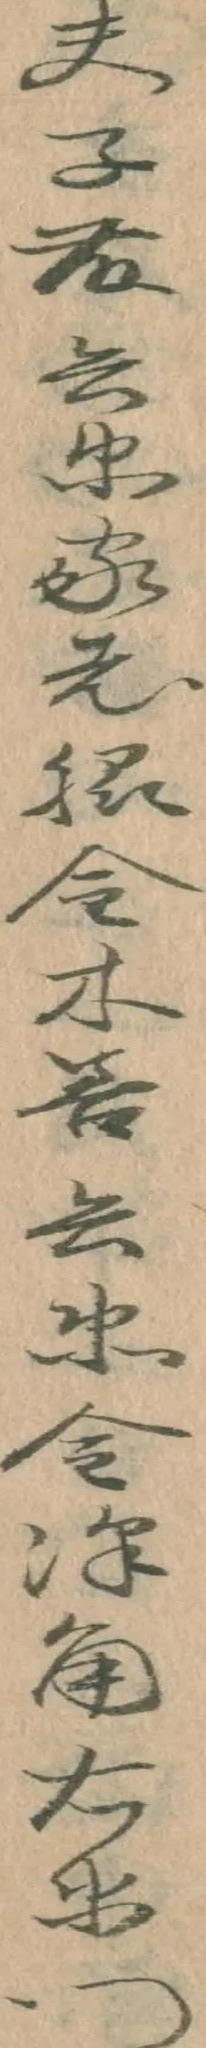夫子藤兵衛家老脇金木善兵衛金沢角右衛門
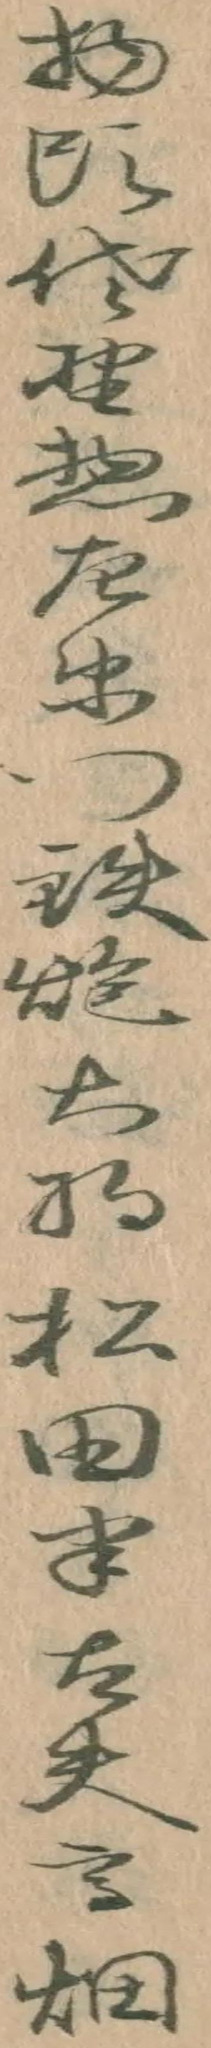物頭佐野惣左衛門鉄炮大将松田半太夫高畑
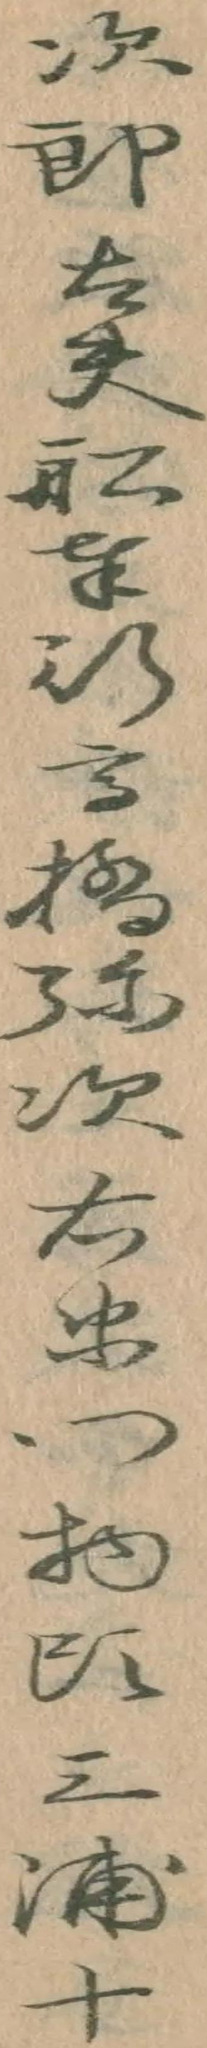次郎太夫舩奉行高橋弥次右衛門物頭三浦十
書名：切支丹御退治記 49巻. [2]
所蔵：国立国会図書館 National Diet Library, JAPAN
